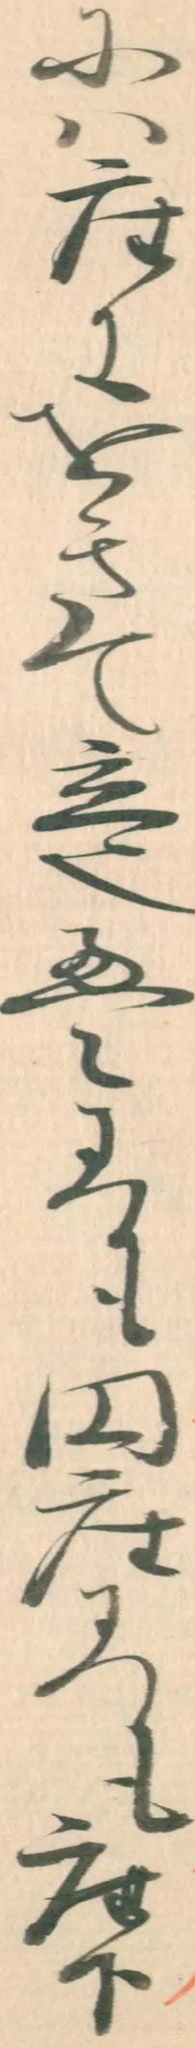には座にをきて立也畳事にても円座にても座下
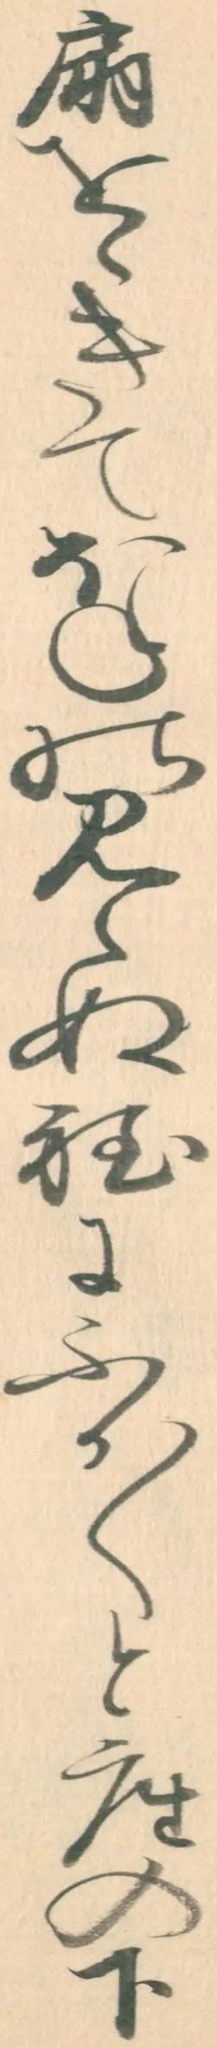扇をゝきてほねの見らぬ程にふか〳〵と座の下
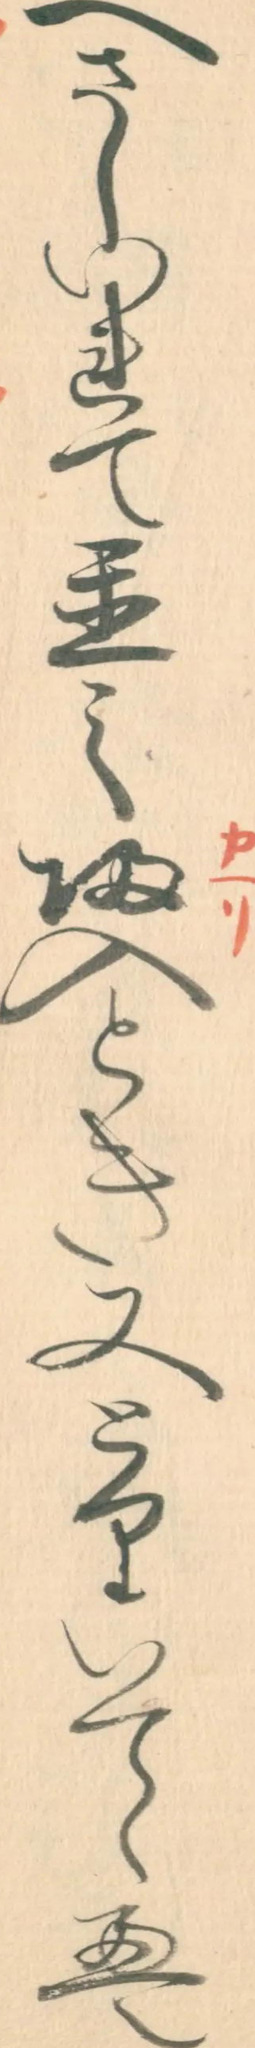へさしいれて置て帰入とき又とりいてゝへし
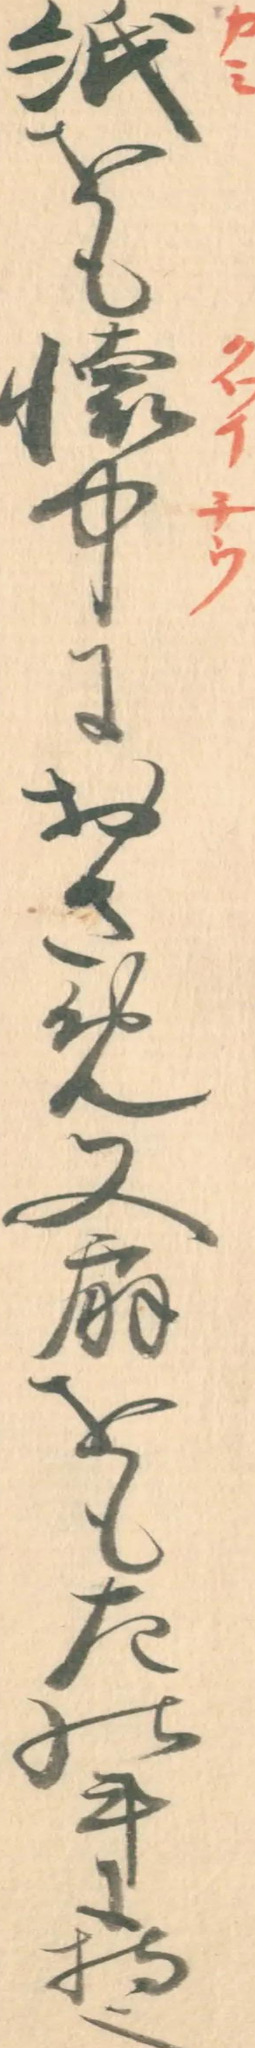紙をも懐中におきめ又扇をものに持也

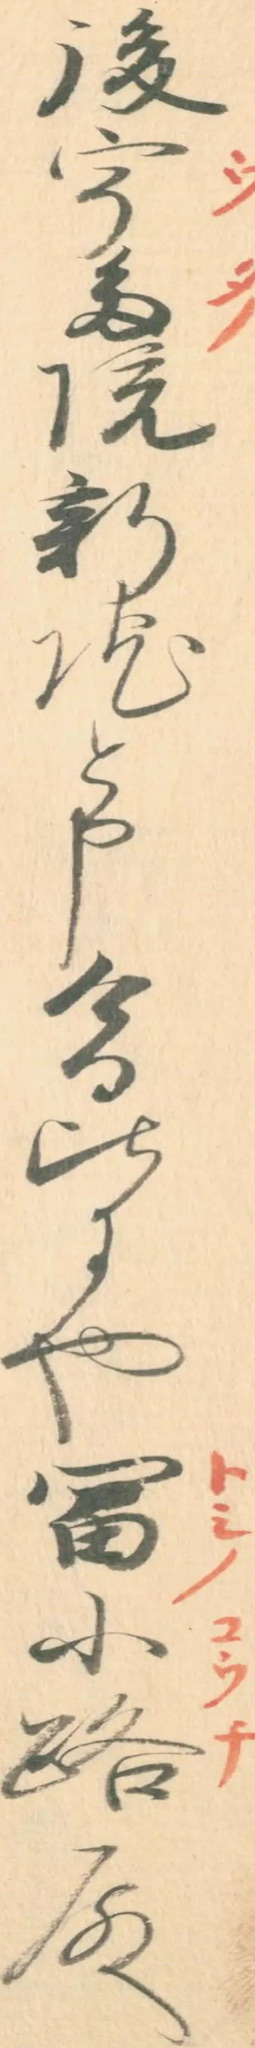後宇多院新院と申しける比にや冨小路殿
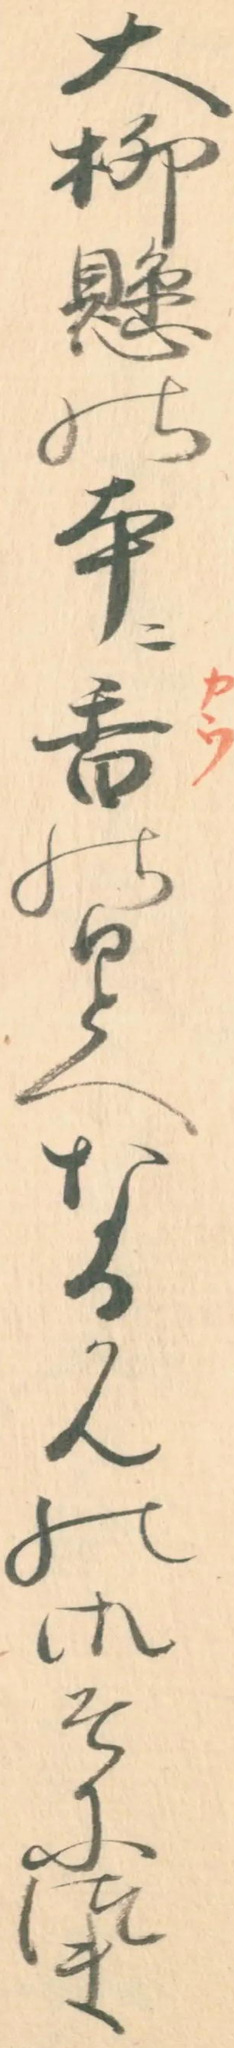大栁懸の本に香のひとへなるかんの御そにつま
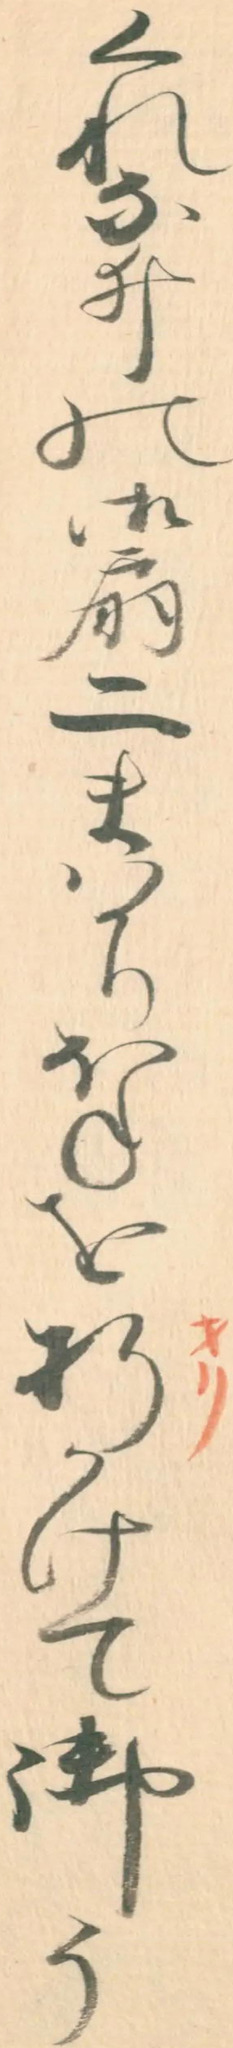くれなゐの御扇二まはりほねを折かけて御う
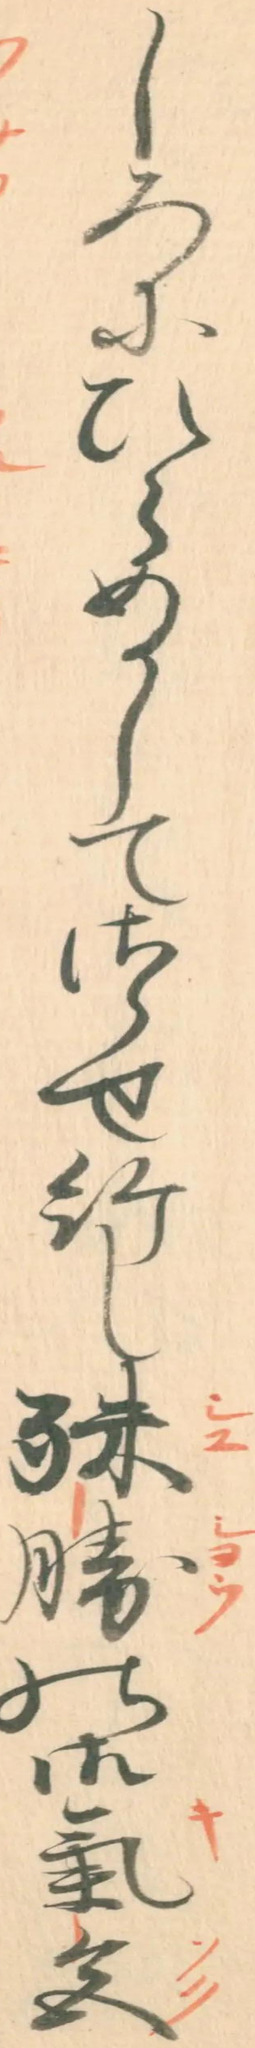しろにひらめかしてつらせ給し殊勝の御氣色
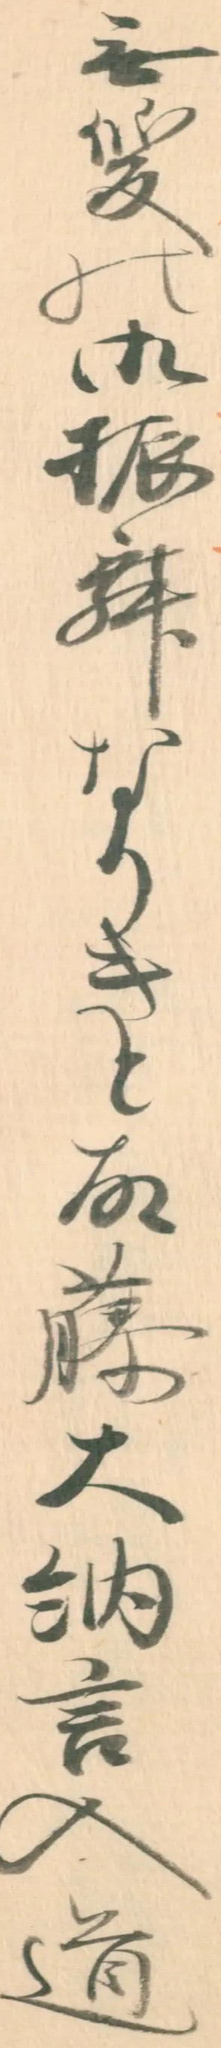無雙の御振舞なりきと故大納言入道
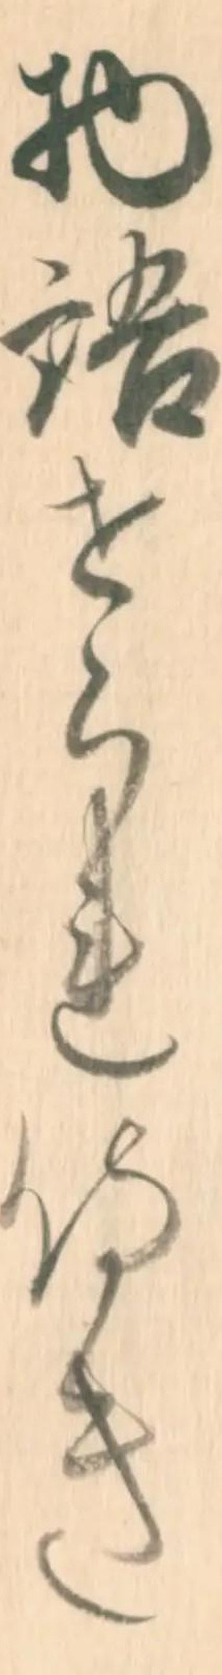物語せられ侍き
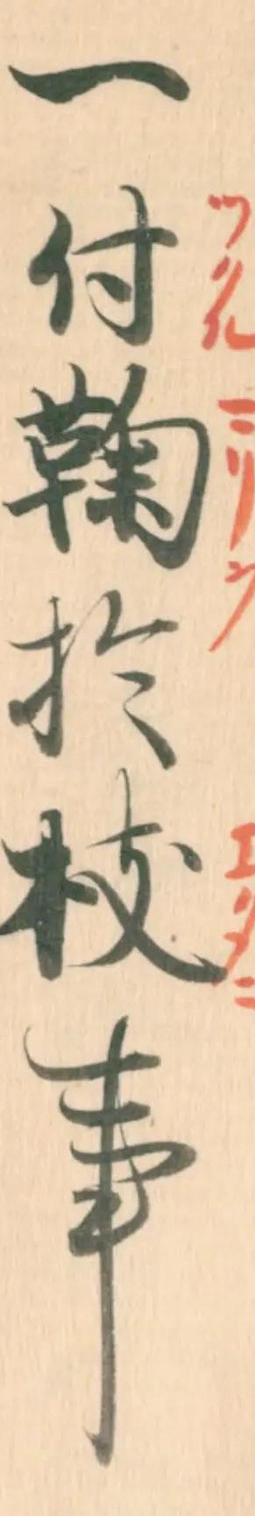一付鞠於杖事
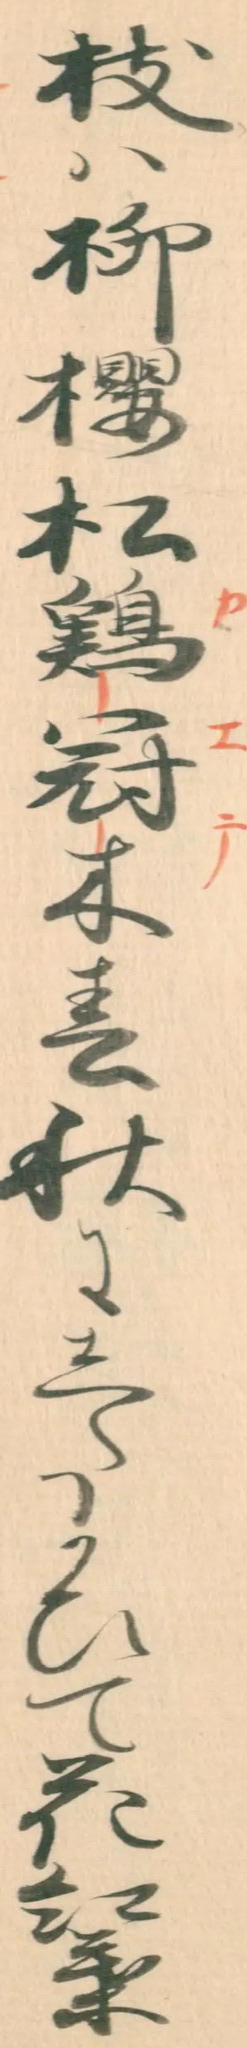枝は柳櫻松鶏冠木春秋にしたかひて花紅葉
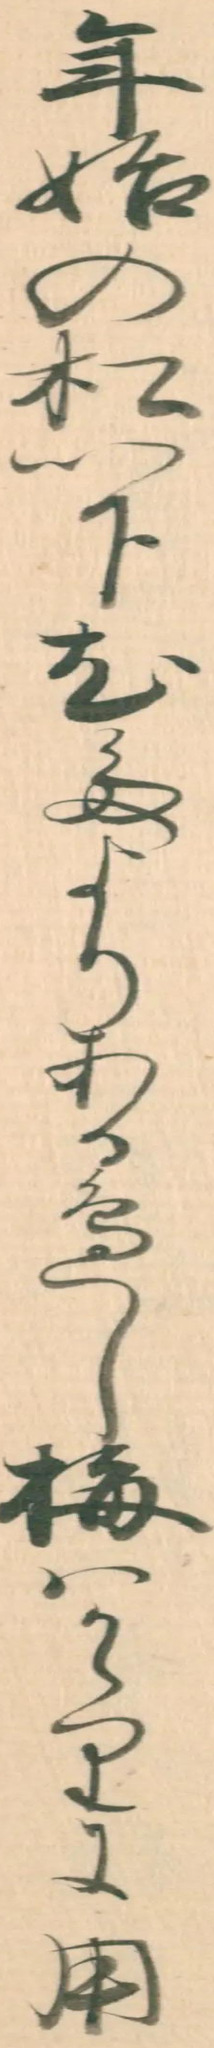年始の松以下尤たよりあるへし梅はかりに用
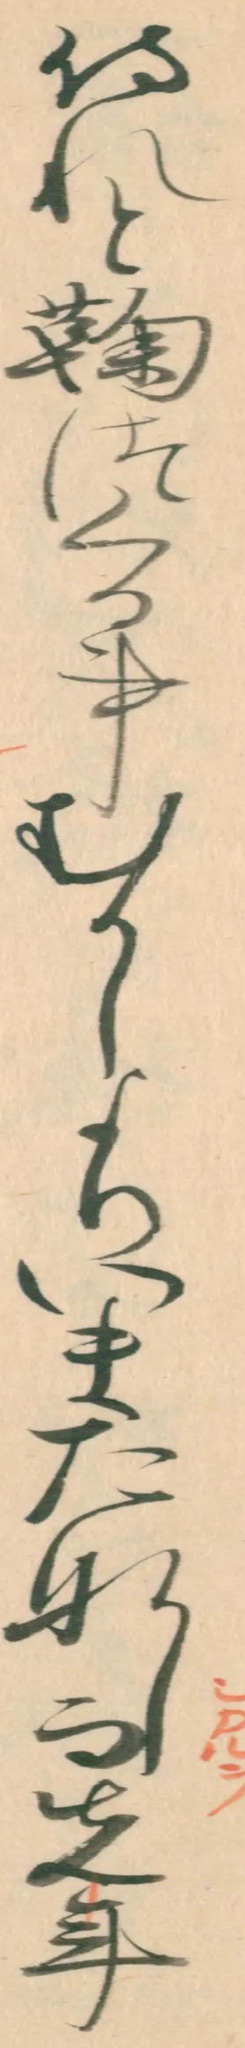侍れと鞠つくることむかしよりいまたなし而先年
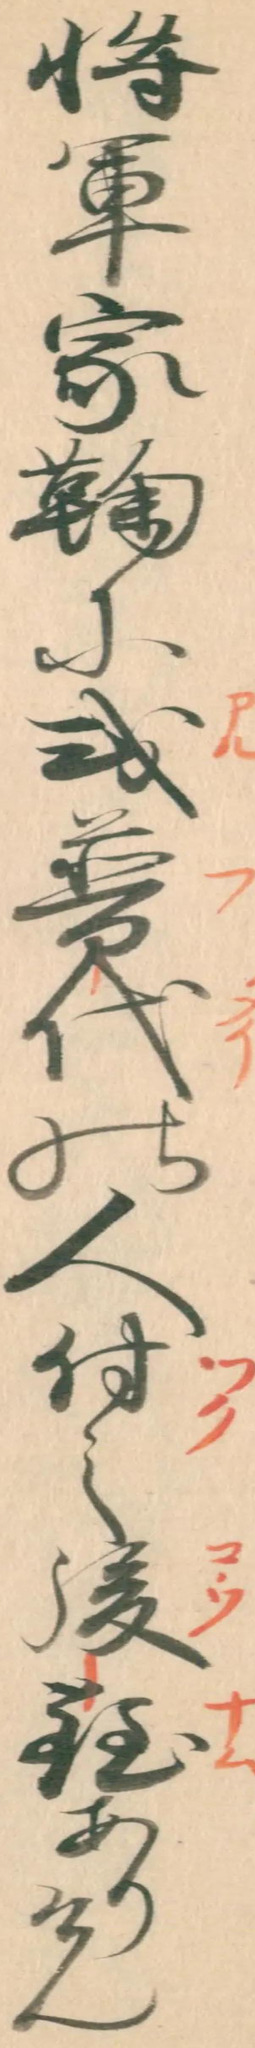将軍家鞠に式普代の人付けて後難ありけん
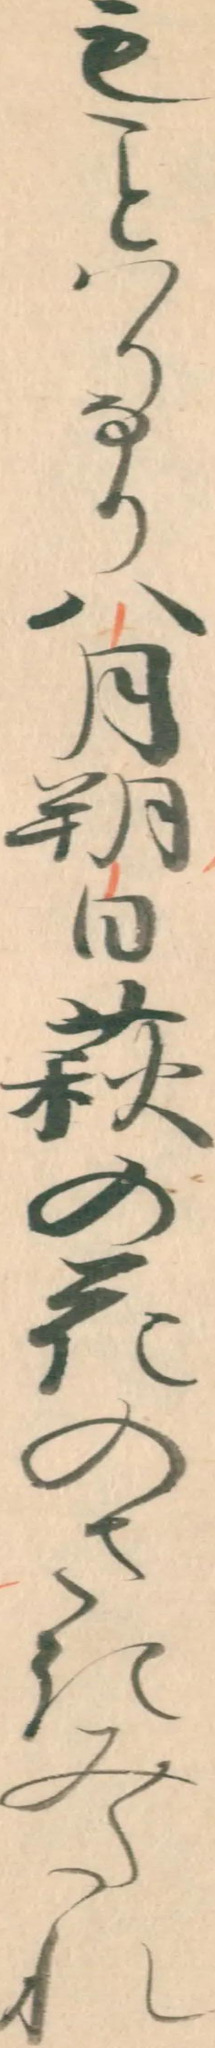もことはりなり八月朔日萩の花さきみたれ
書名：遊庭秘抄 2巻. [1]
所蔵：国立国会図書館 National Diet Library, JAPAN
